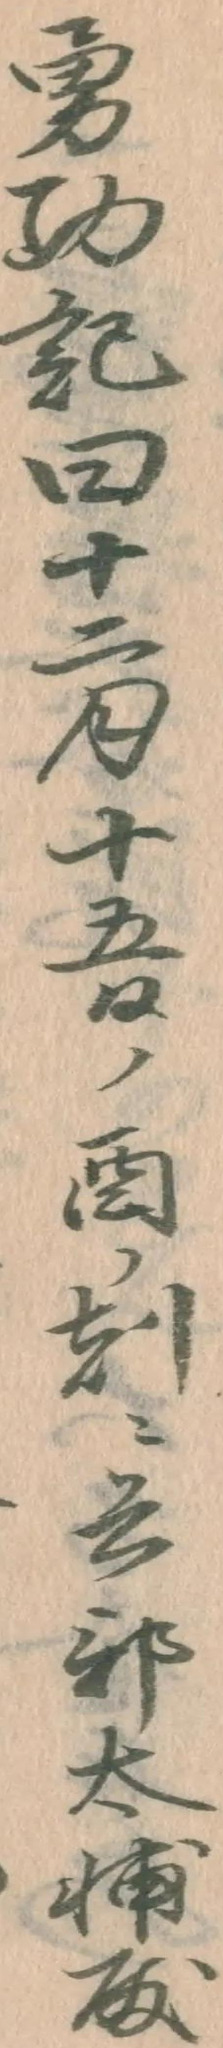勇功記曰十二月十五日之酉之刻に兵部太輔殿
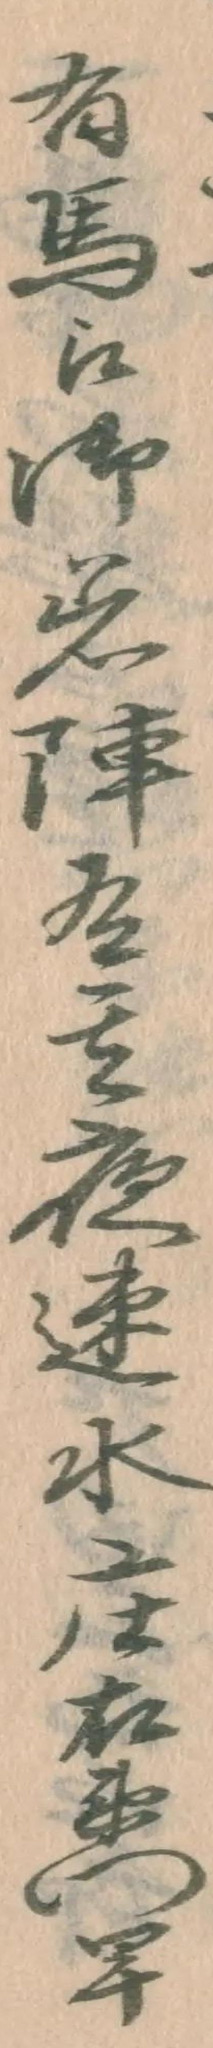有馬得御着陣有其夜速水庄右衛門早
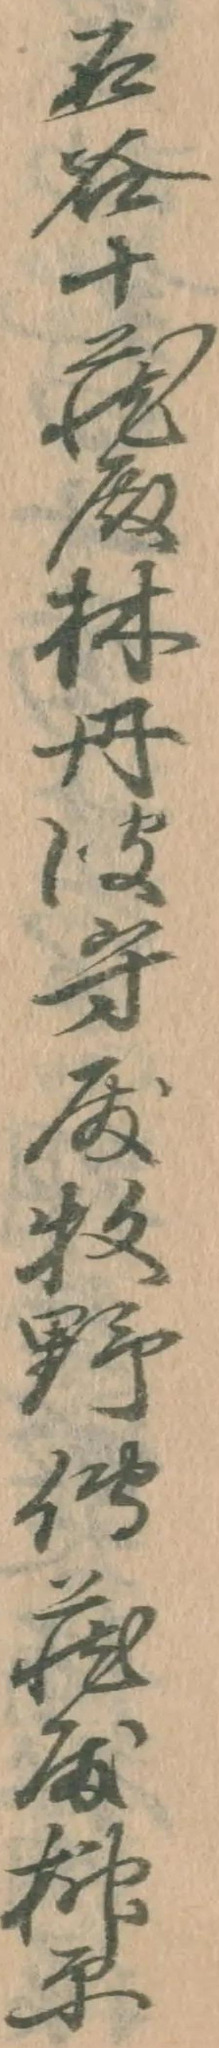石谷十蔵殿林丹波守殿牧野伝蔵殿榊原
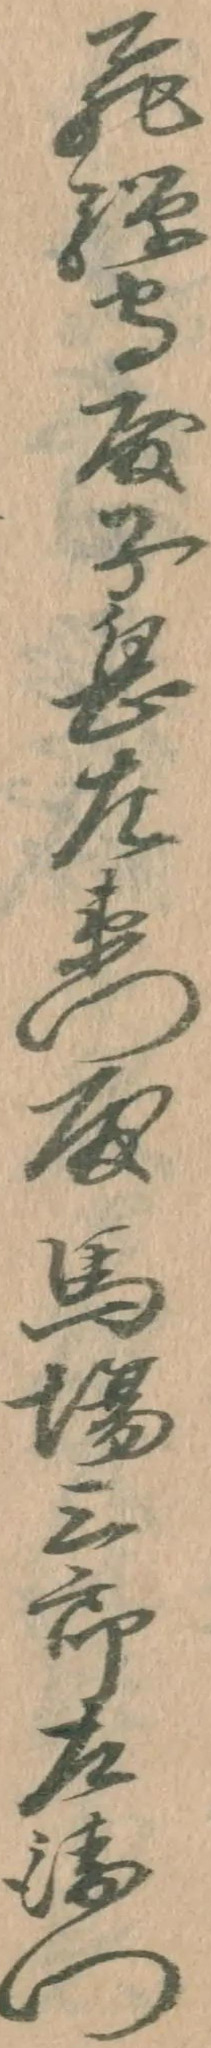飛騨守殿子息左衛門殿馬場三郎左衛門
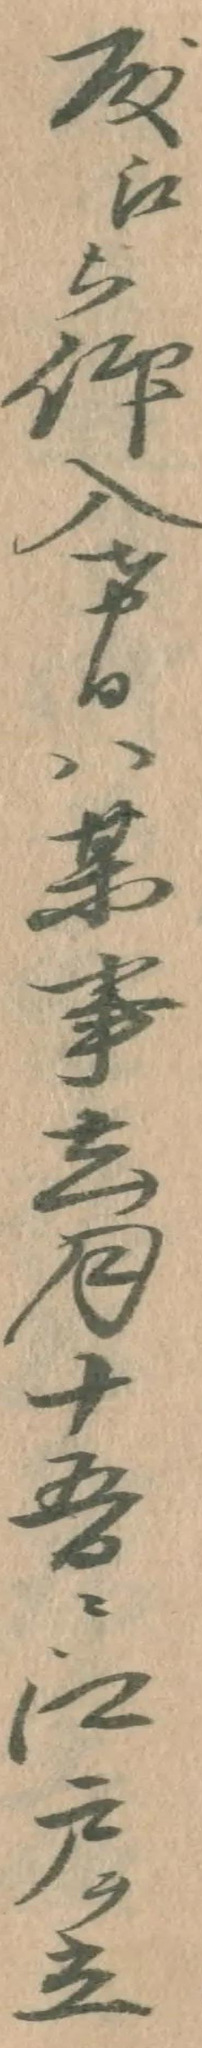殿江被仰入希るは某事去月十五日江戸を立
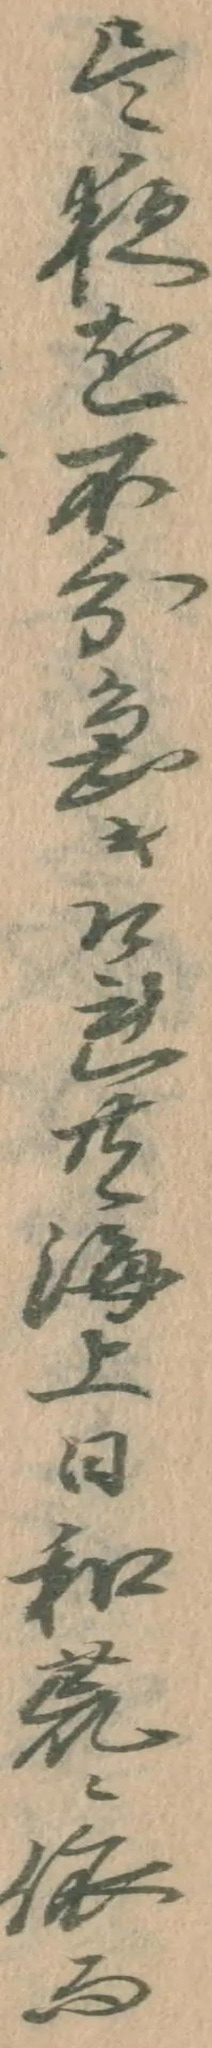尽夜を不分急きけ連共海上日和荒に依而
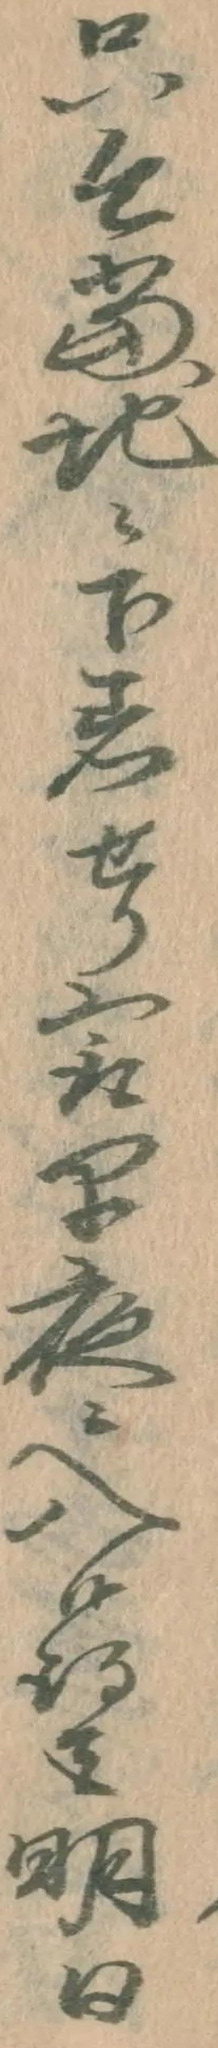只今当地に下着せり最早夜に入候得者明日
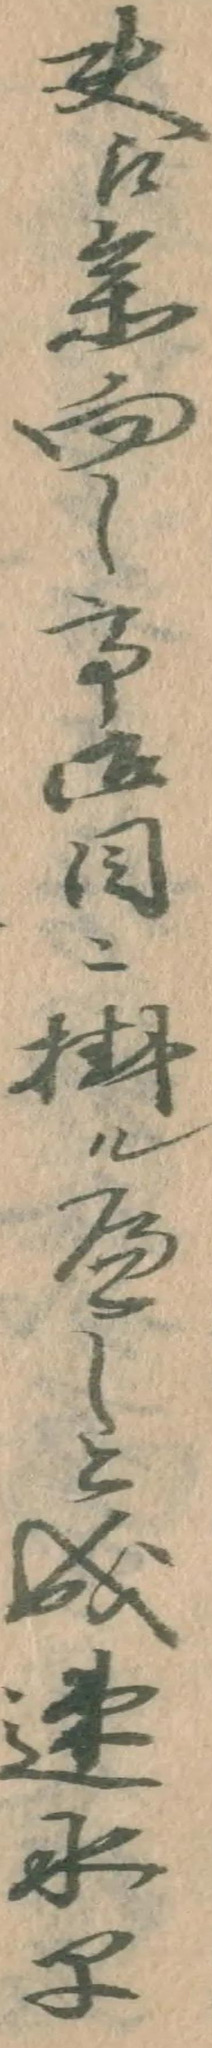夫江参向し亭御目に掛る扁しと成速水早
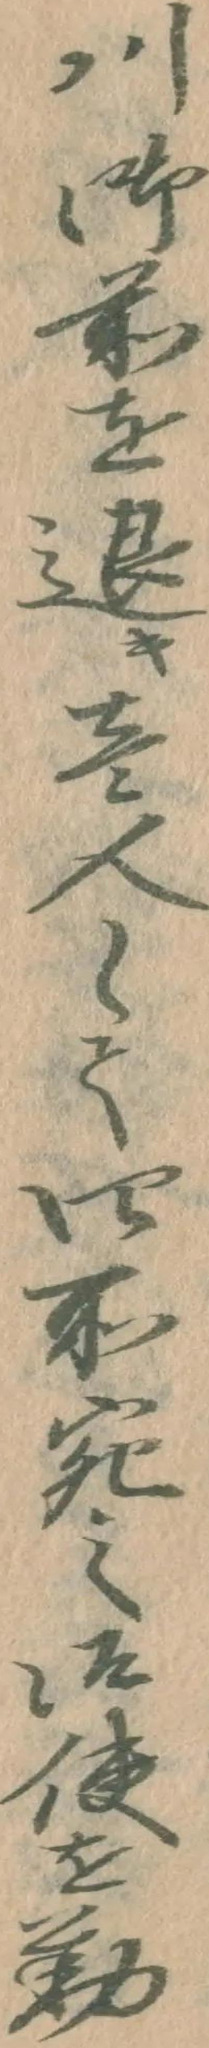川御前を退き壱人して四取宛之御使を勤
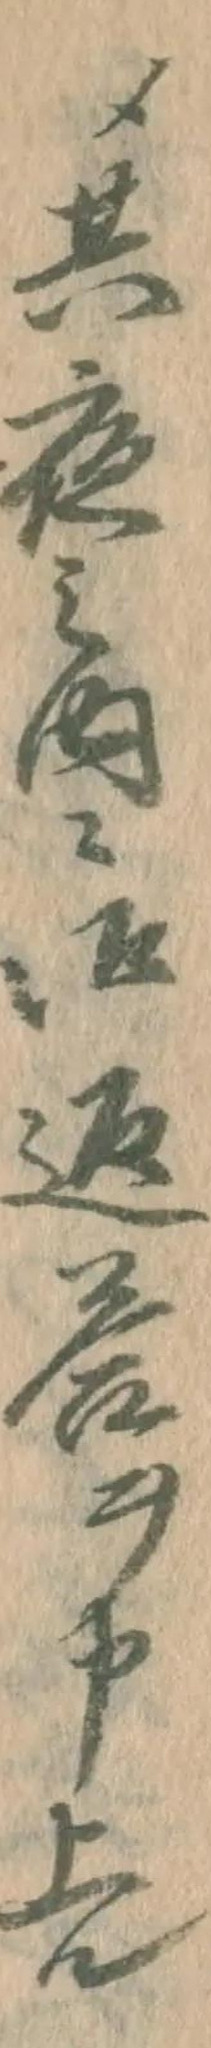め其夜之内に御返答を申上る
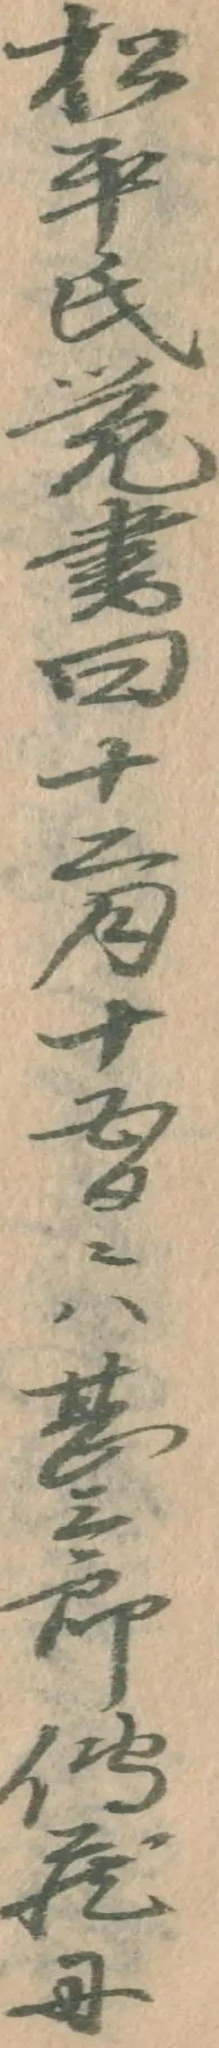松平氏覚書曰十二月十五日には甚三郎伝蔵丹
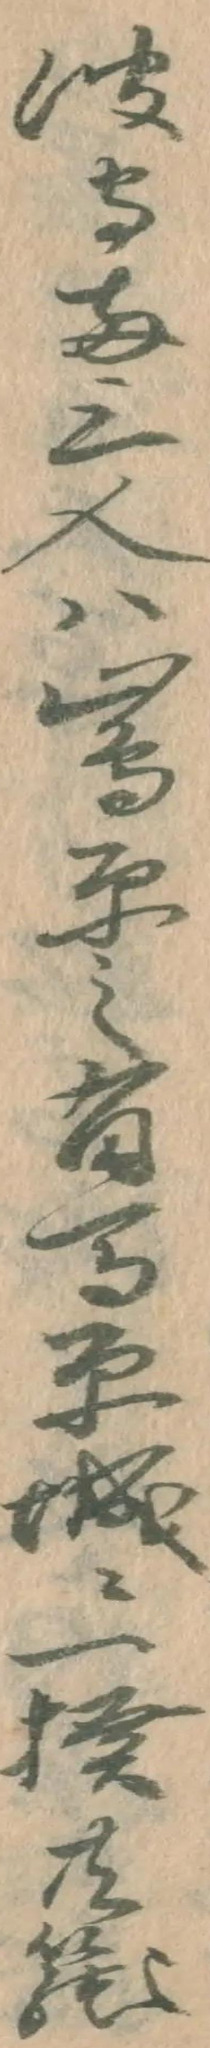波守両三人は島原之有馬原城に一揆共籠

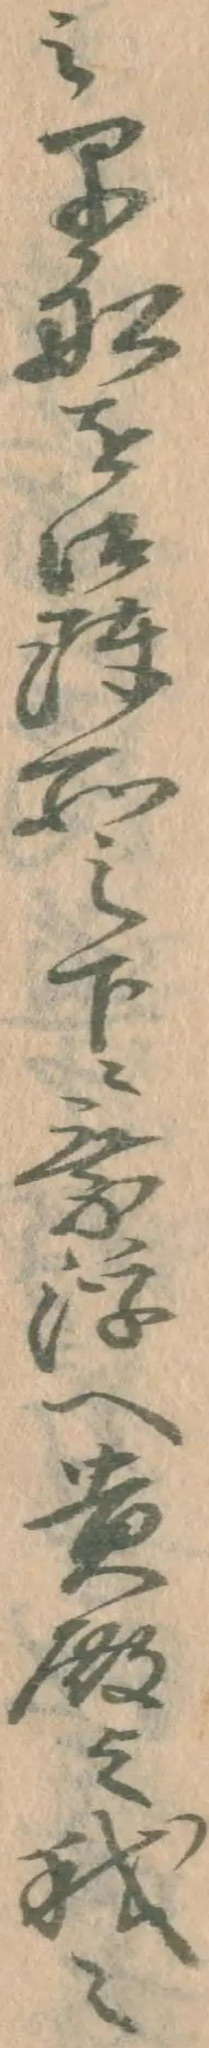之早舩を御陳所之下に乗浮へ貴殿与我々
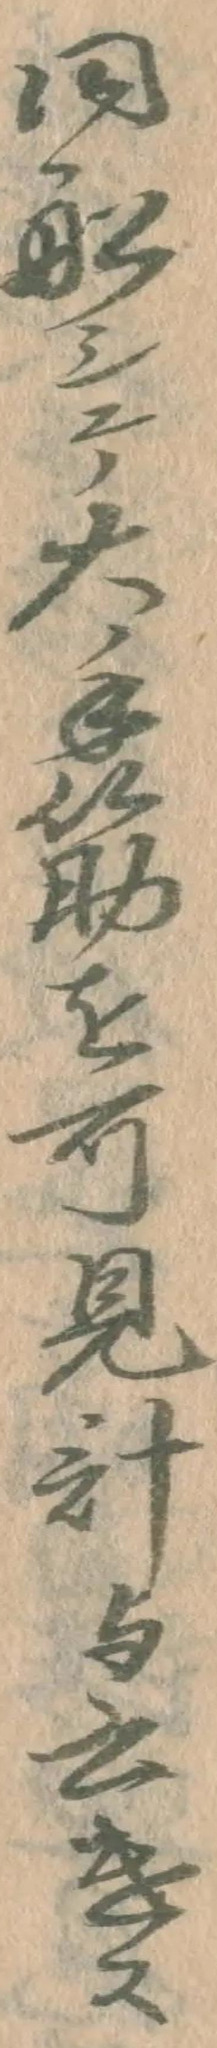同舩して大手筋を可見計与云遣す
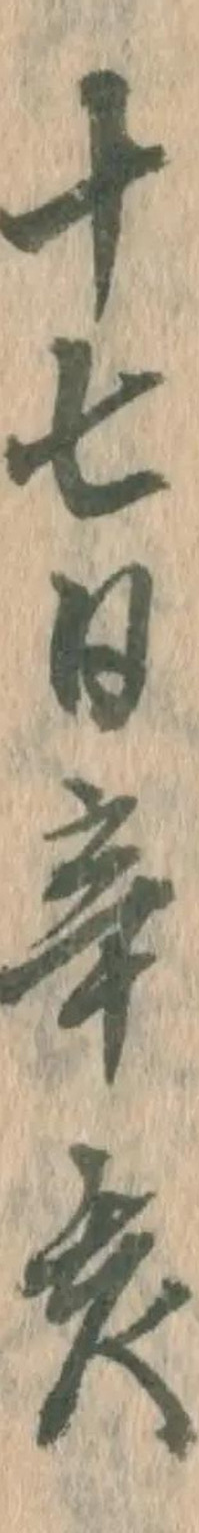十七日辛亥
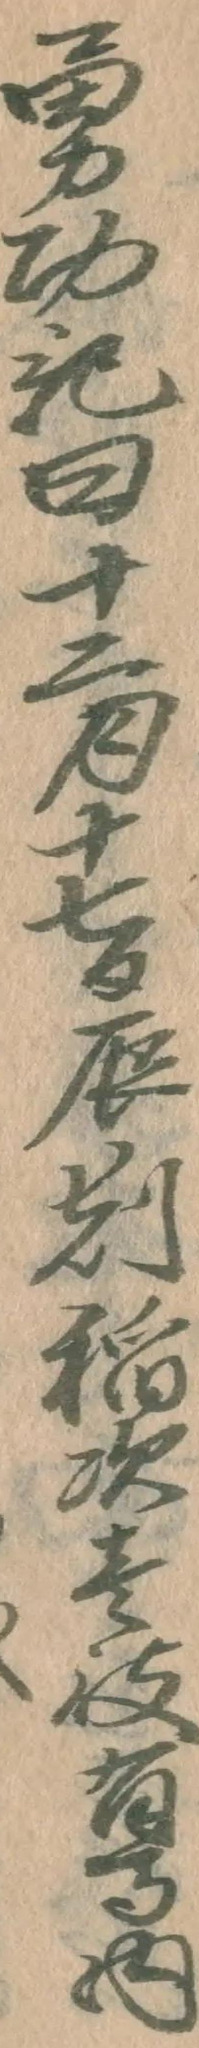勇功記曰十二月十七日辰刻稲次壱岐有馬内
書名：切支丹御退治記 49巻. [4]
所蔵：国立国会図書館 National Diet Library, JAPAN
